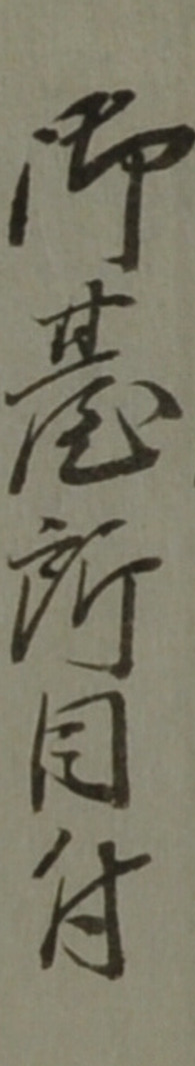御台所目付
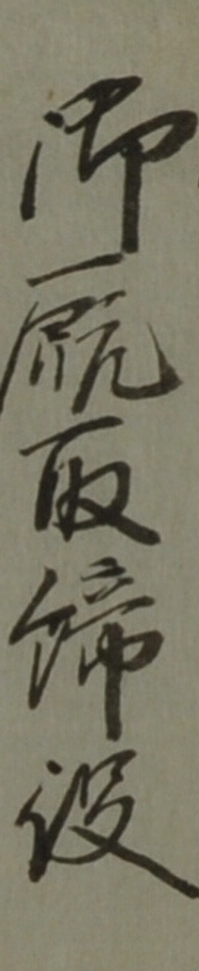御厩取締役
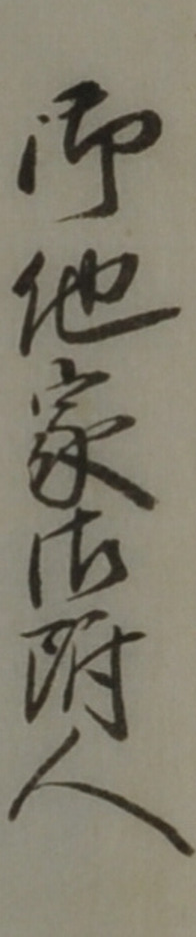御他家御附人
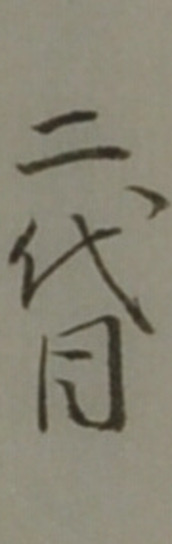二代目
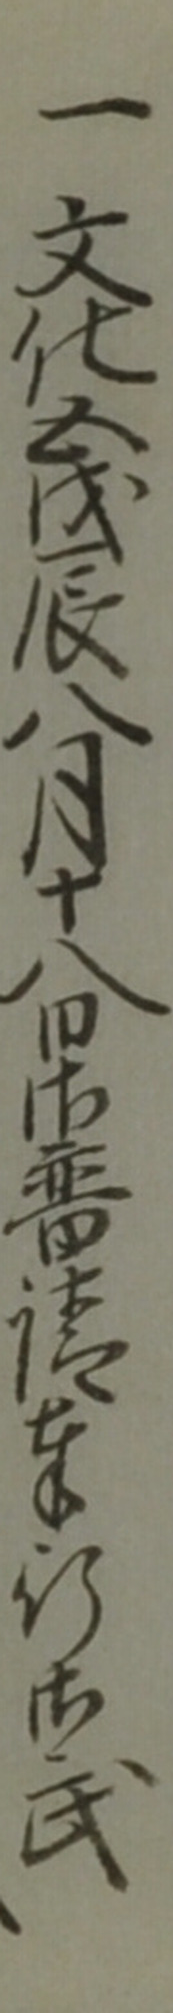一文化五戌辰八月十八日御普請奉行御武
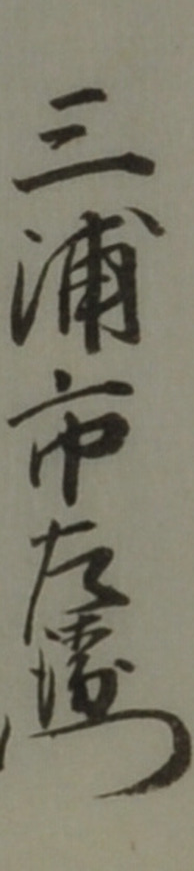三浦市左衛門
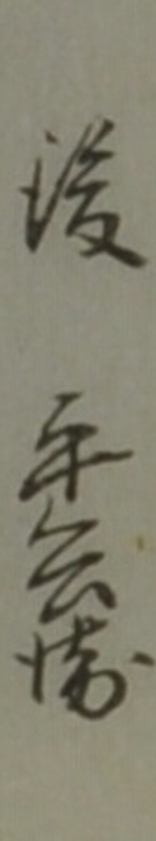後平兵衛
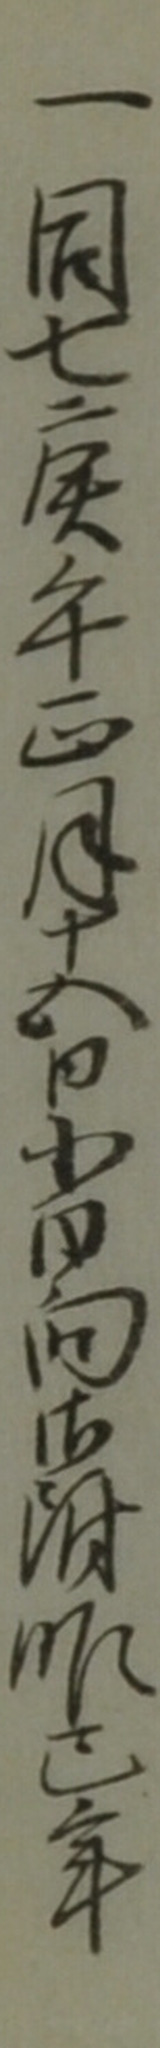一同七庚午正月十五日小日向御附昨巳年
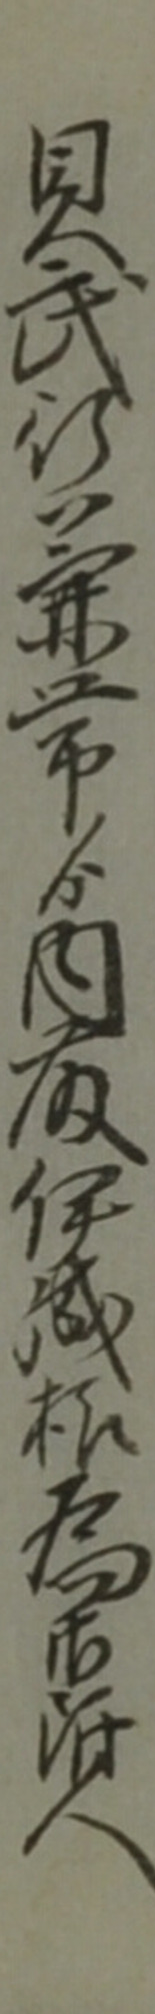具武行兼帯より内藤伊織様為御附人
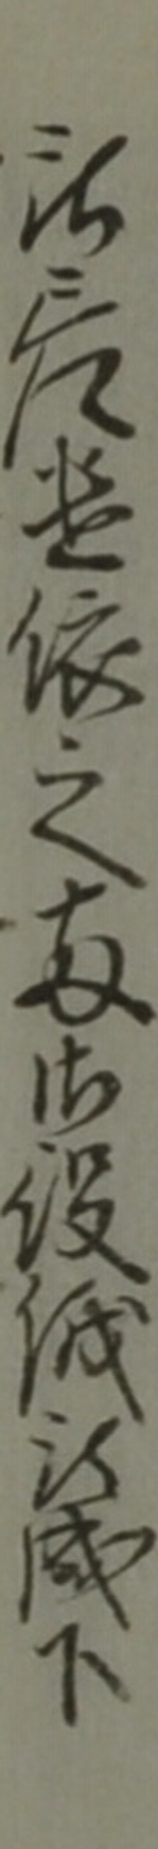被差遣依之両御役儀被成下
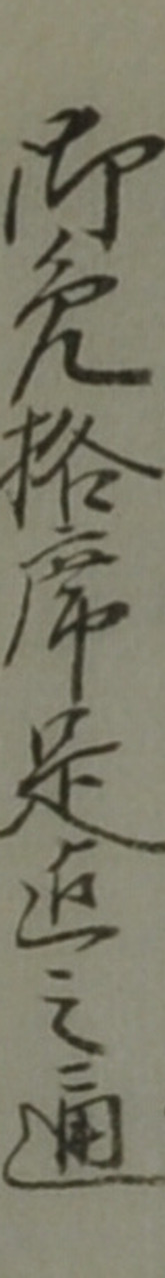御免格席是迄之通
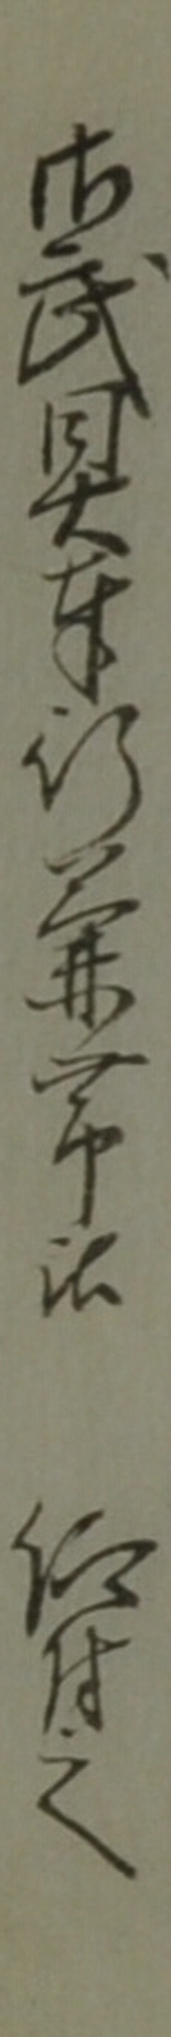御武具奉行兼帯被仰付之
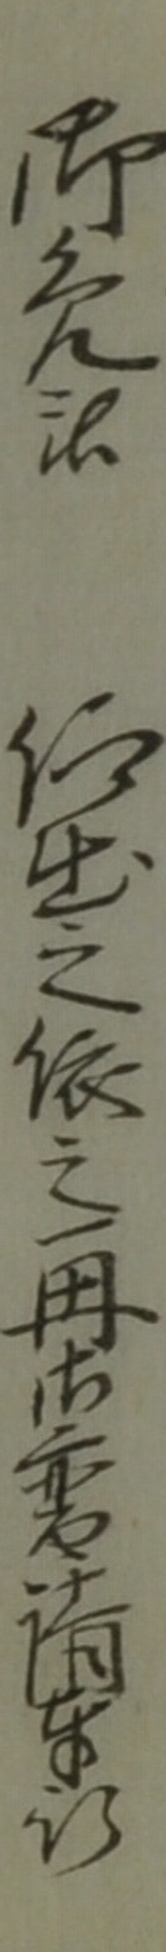御免被仰出之依之再御普請奉行
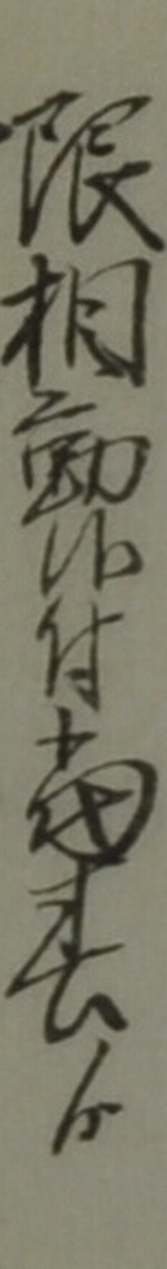限相勤候付当春より
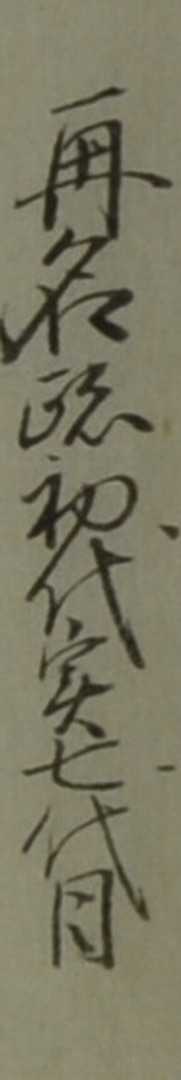再名跡初代実七代目
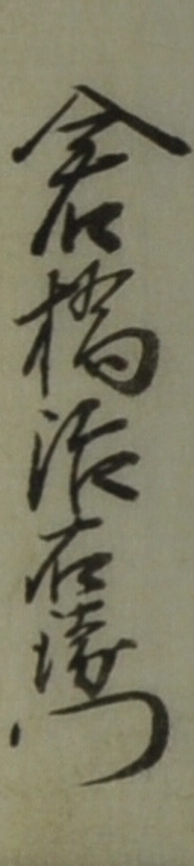倉橋治右衛門
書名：諸御役代々録（八）
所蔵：伊那市立高遠町図書館・合同会社AMANE
